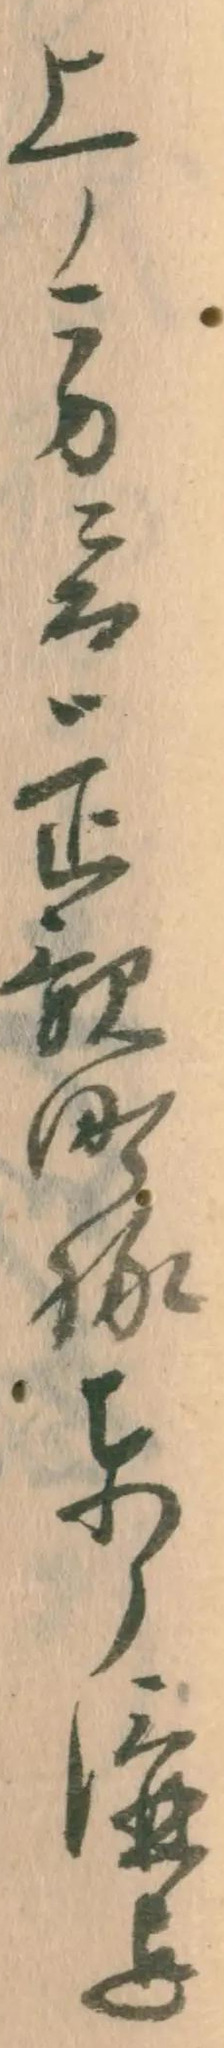上ノ方ニ而正親町様東ノ溝迄
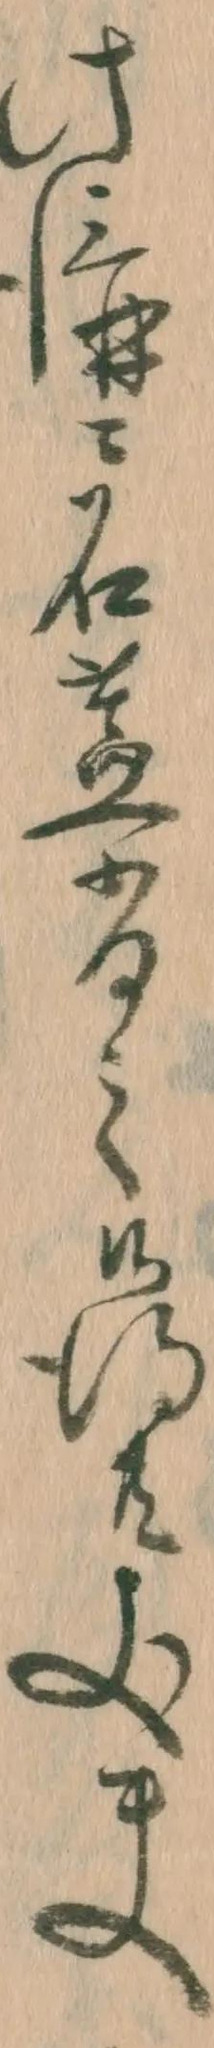此溝ニ石蓋有之候得共丈夫
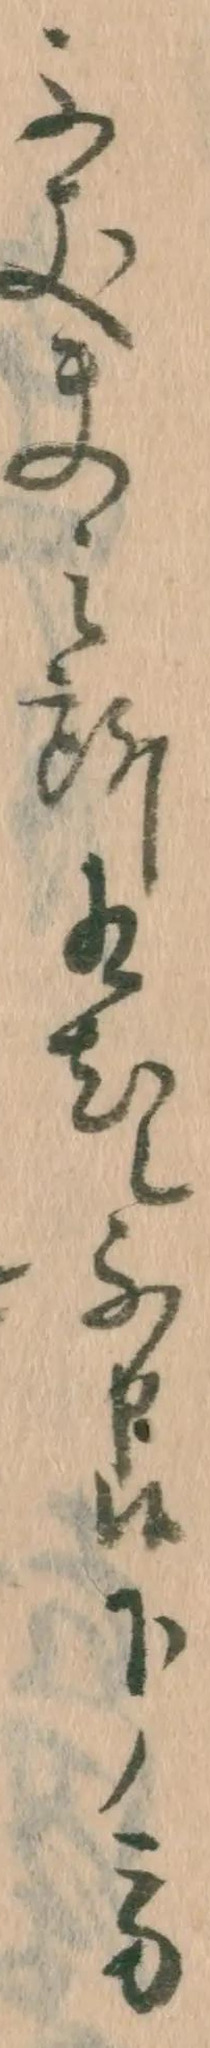不丈夫之所相知レ不申候下ノ方
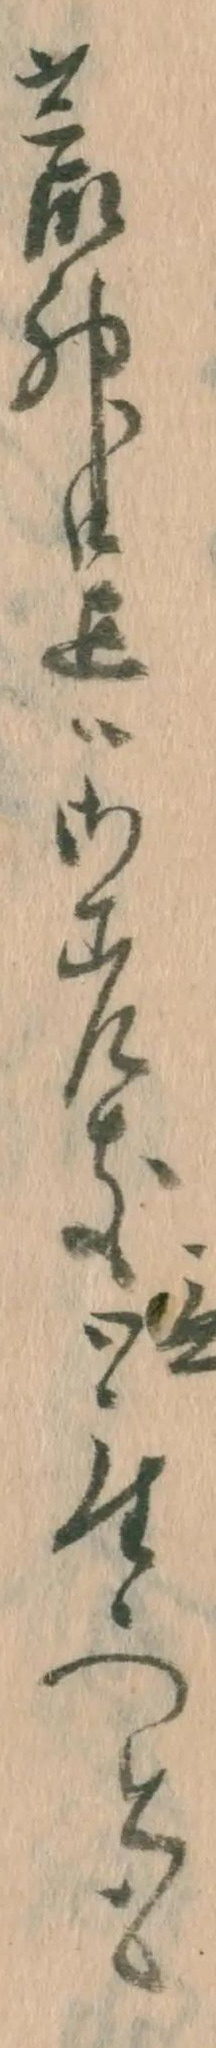荒神口迄ハ御差支無御座候へとも
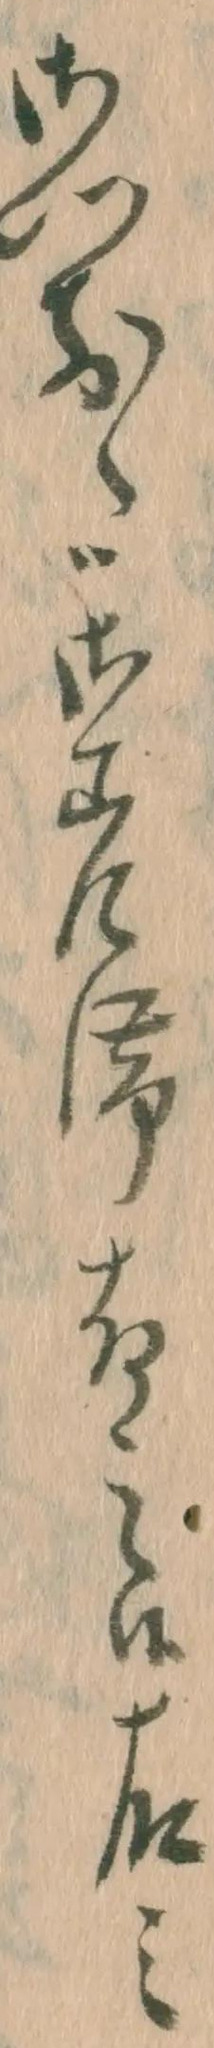御門前へハ御差滞有之候右之
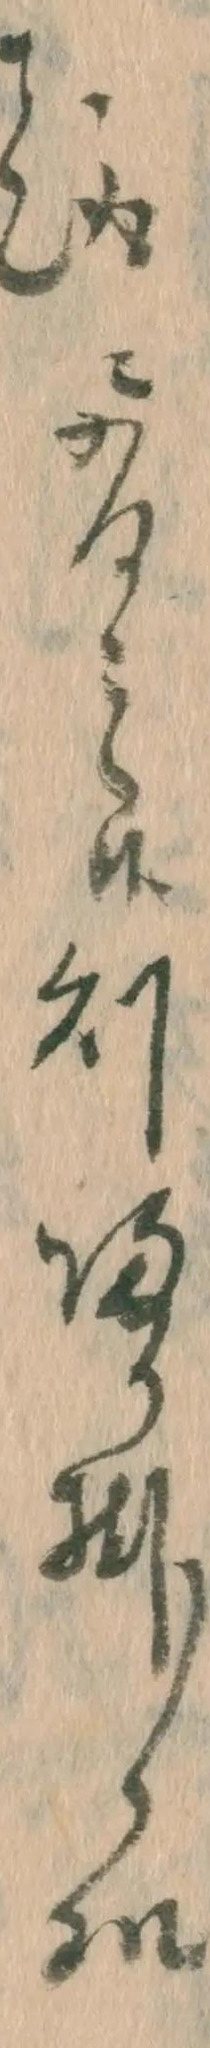趣ニ有之候則帰り掛候処
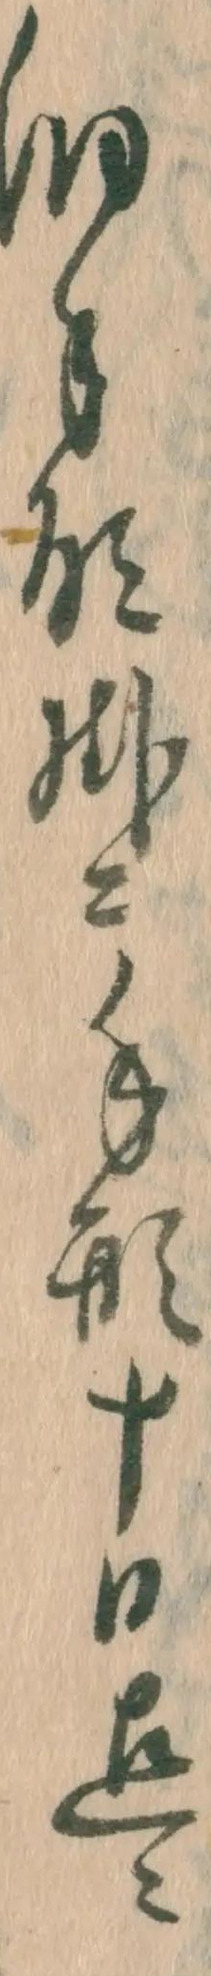納手形掛ニ手形十日迄ニ
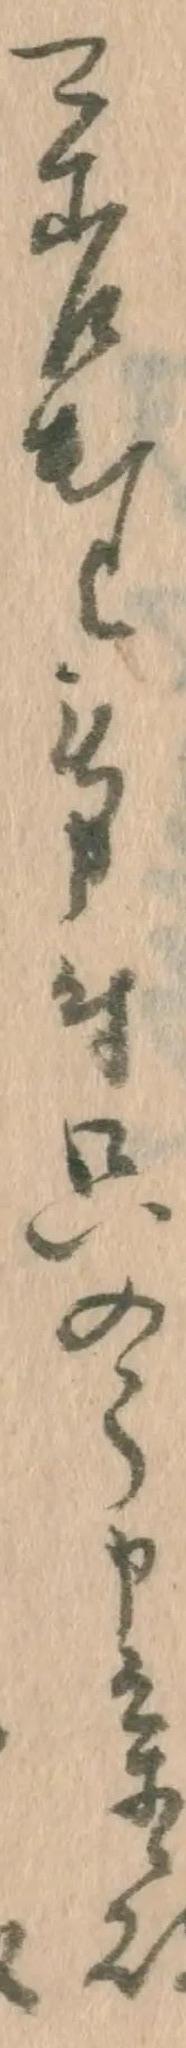可差出与被申付只今申参候故
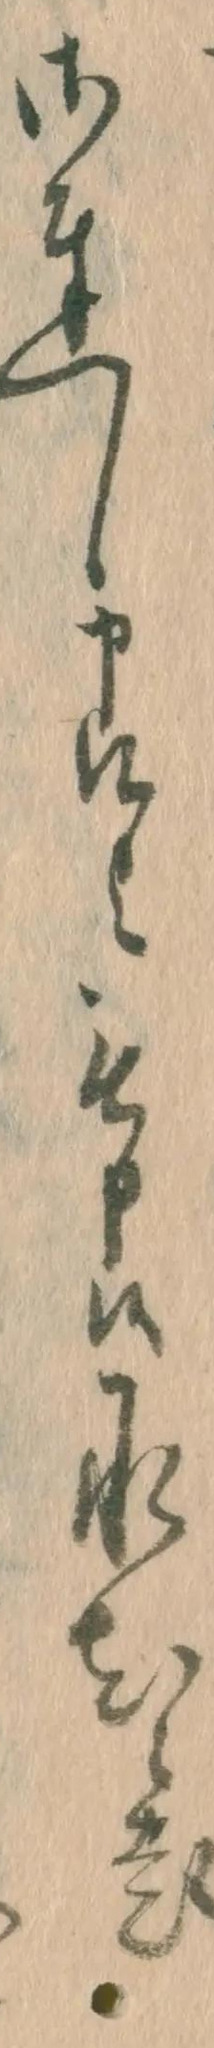御達候申候与被申候承知候趣
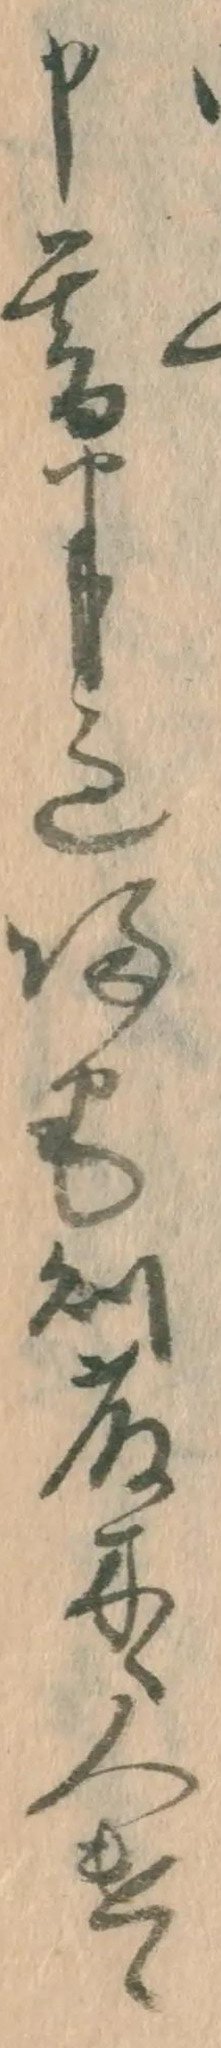申暮半過帰宅則藤木へ人遣候

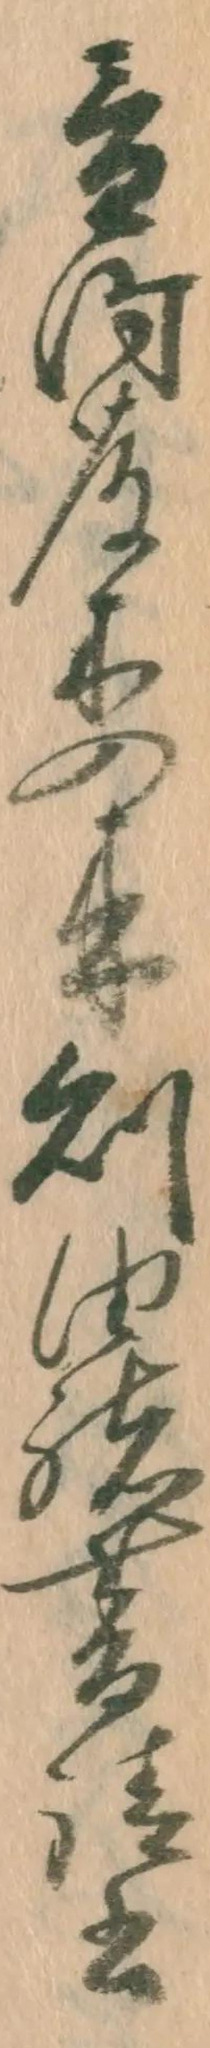九日昼時藤木入来則由緒書請書
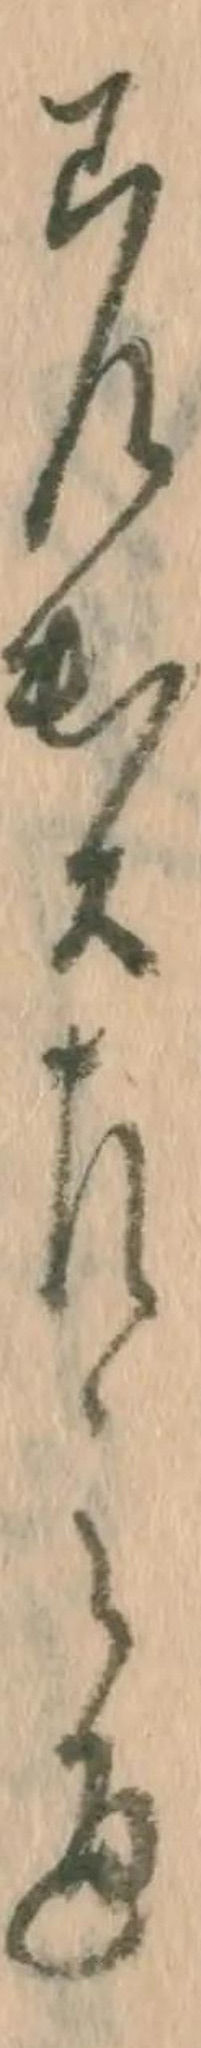差出ス左之通
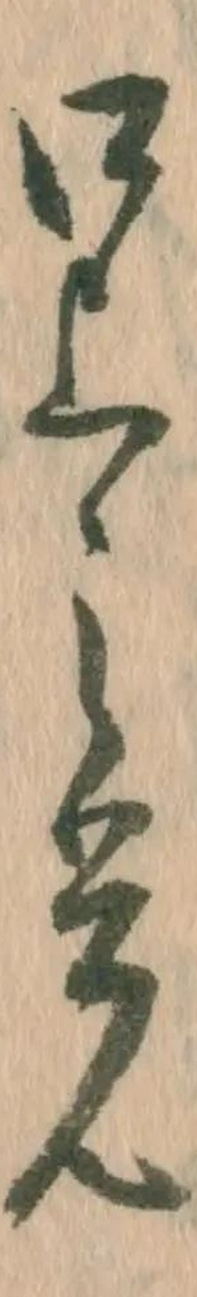口上之覚
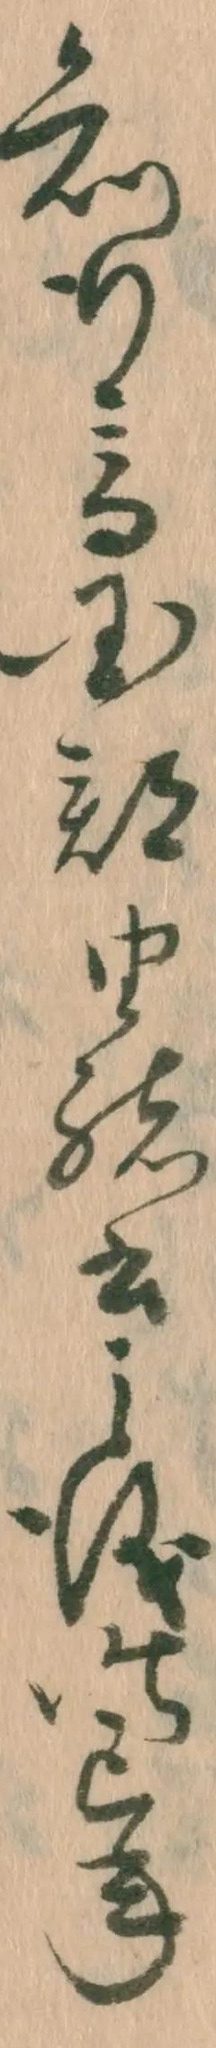知行高国郡由緒書之儀昨巳年
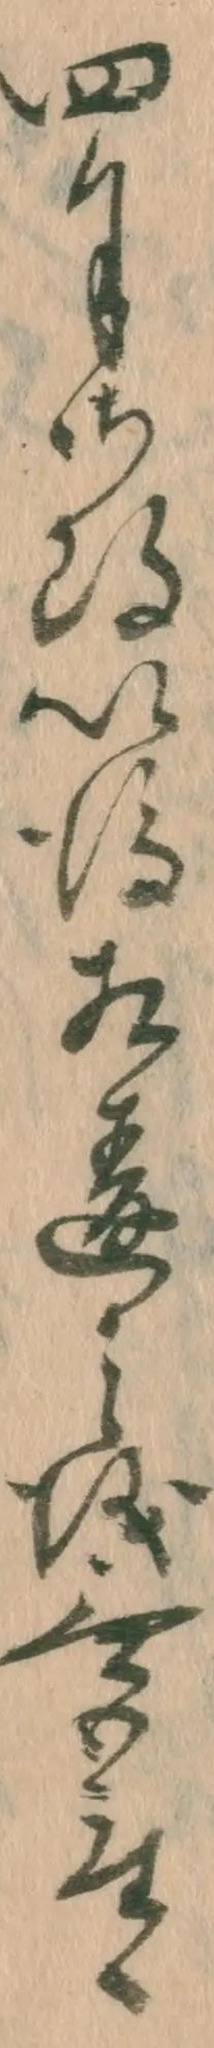四月御改以後相違之儀無御座候
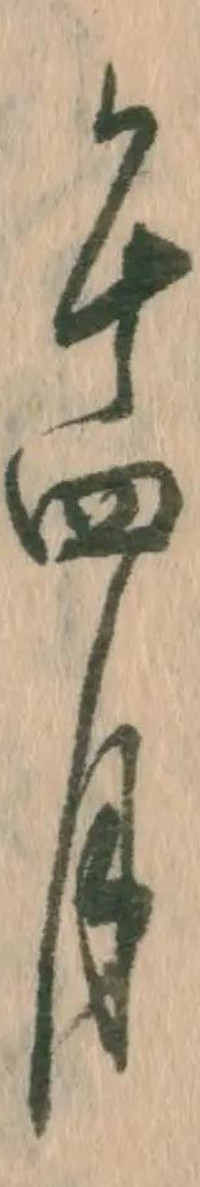午四月
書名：賀茂社記録. 第61冊
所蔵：国立国会図書館 National Diet Library, JAPAN
